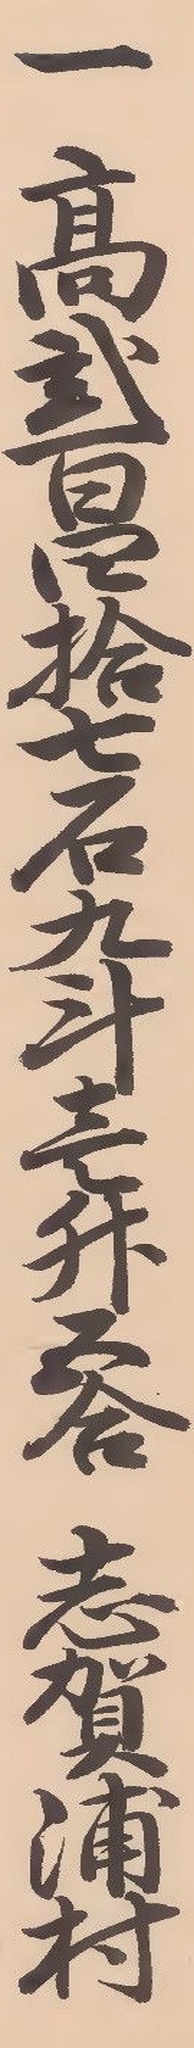一高弐百四拾七石九斗壱升五合志賀浦村
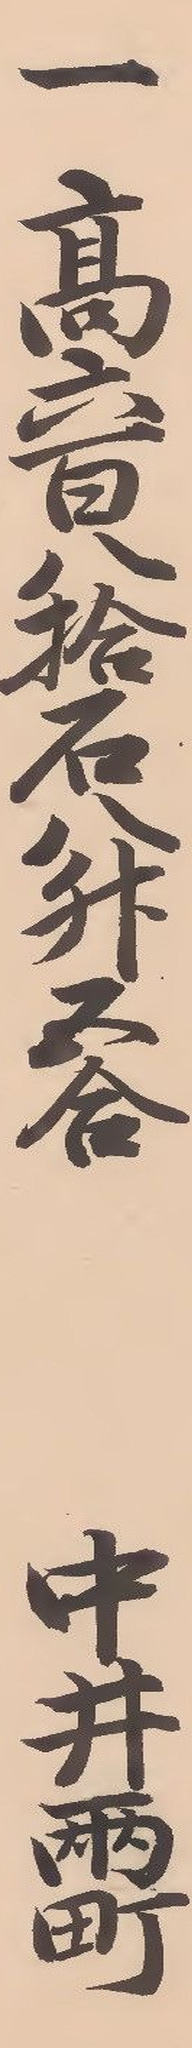一高六百八拾石八升五合中井両町
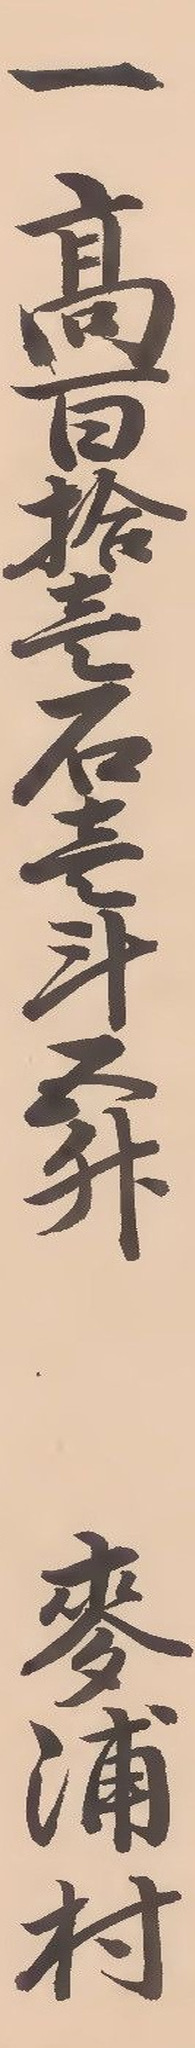一高百拾壱石壱斗五升麦浦村
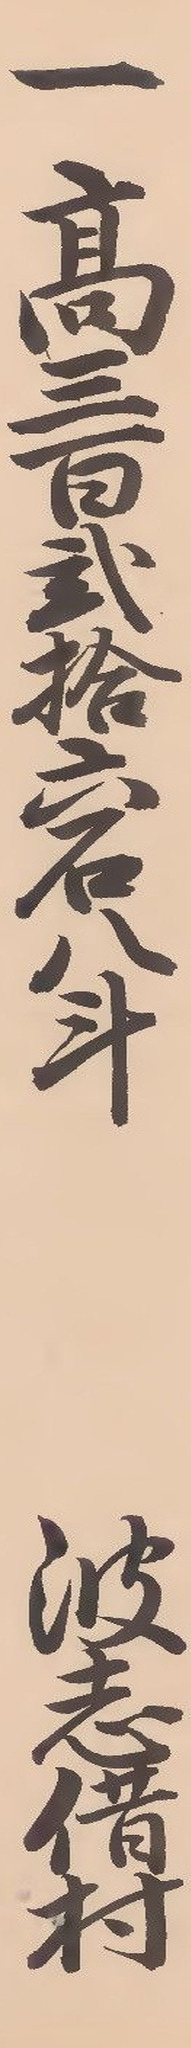一高三百弐拾六石八斗波志借村
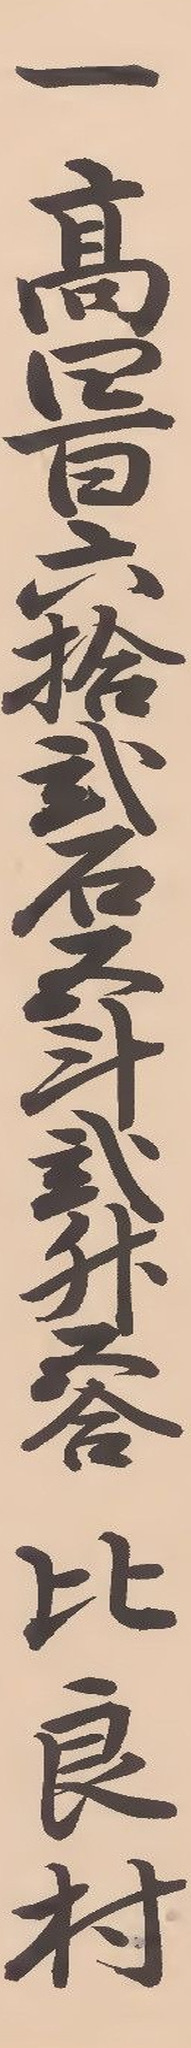一高四百六拾弐石五斗弐升五合比良村
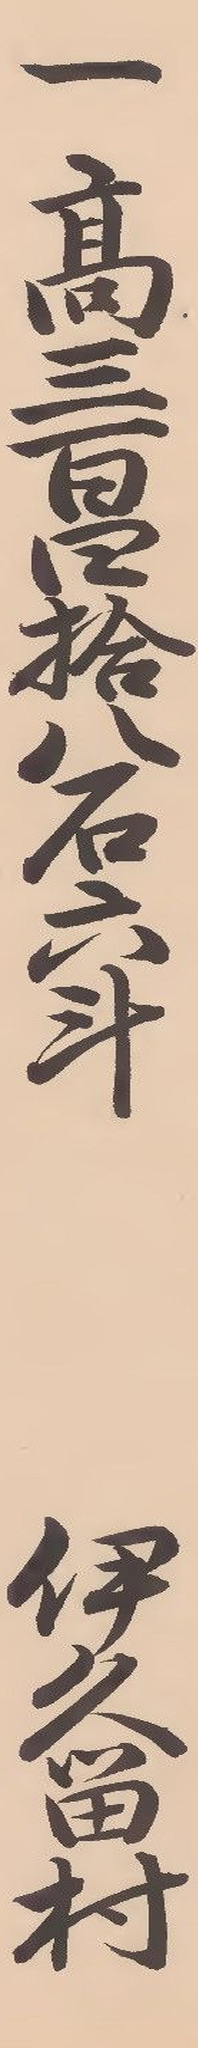一高三百四拾八石六斗伊久留村
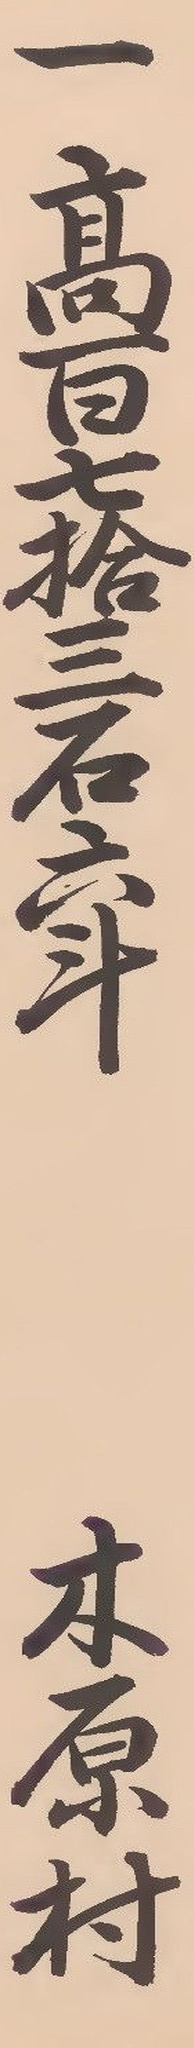一高百七拾三石六斗木原村

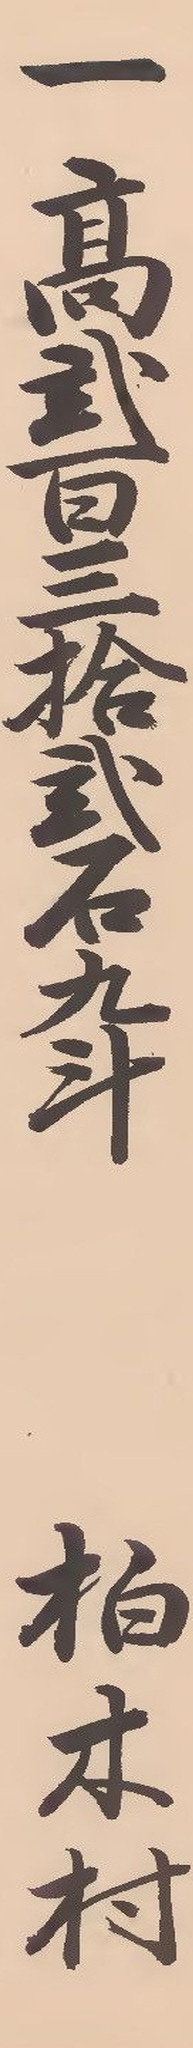一高弐百三拾弐石九斗柏木村
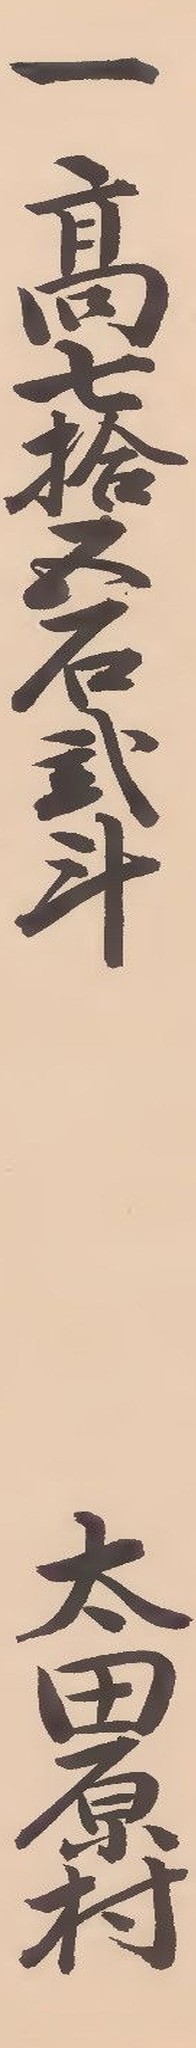一高七拾五石弐斗太田原村
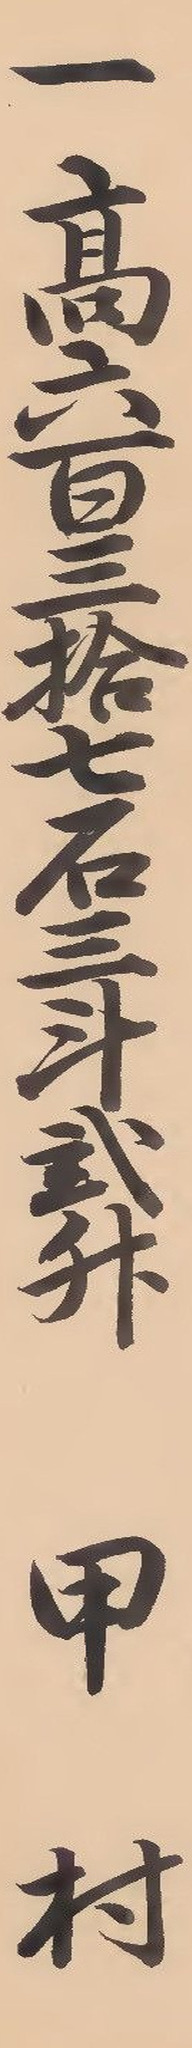一高六百三拾七石三斗弐升甲村
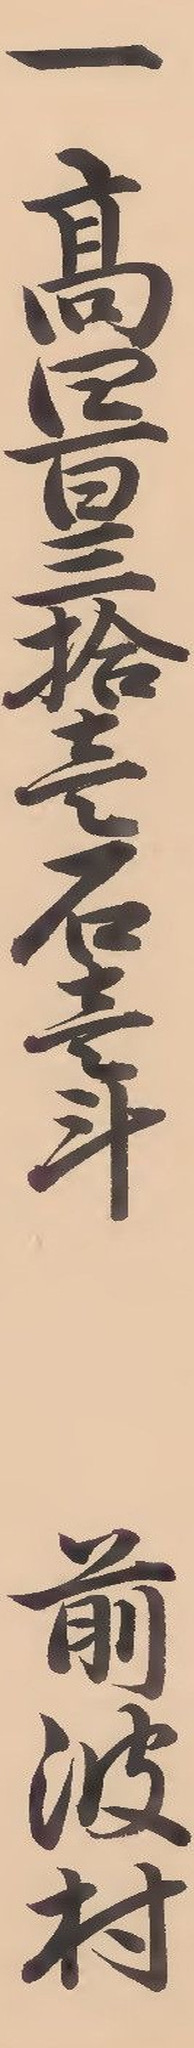一高四百三拾壱石壱斗前波村

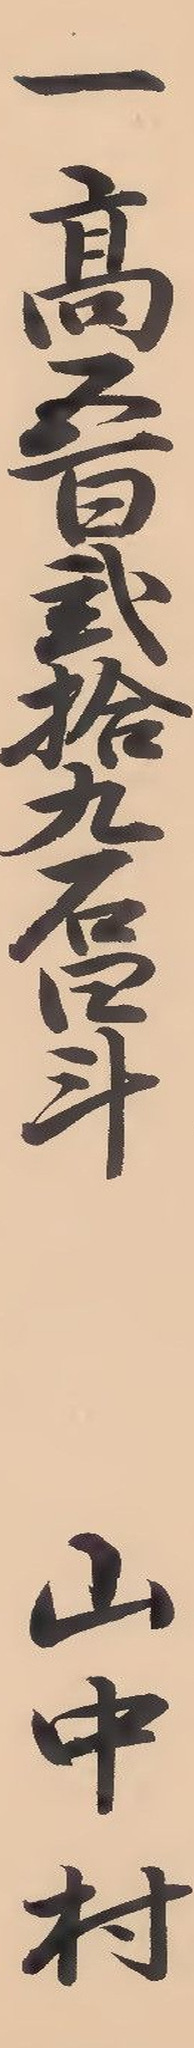一高五百弐拾九石四斗山中村
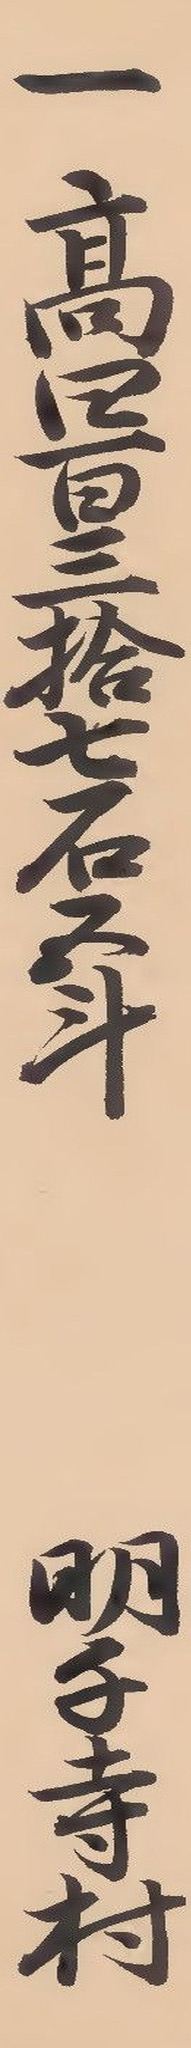一高四百三拾七石五斗明千寺村
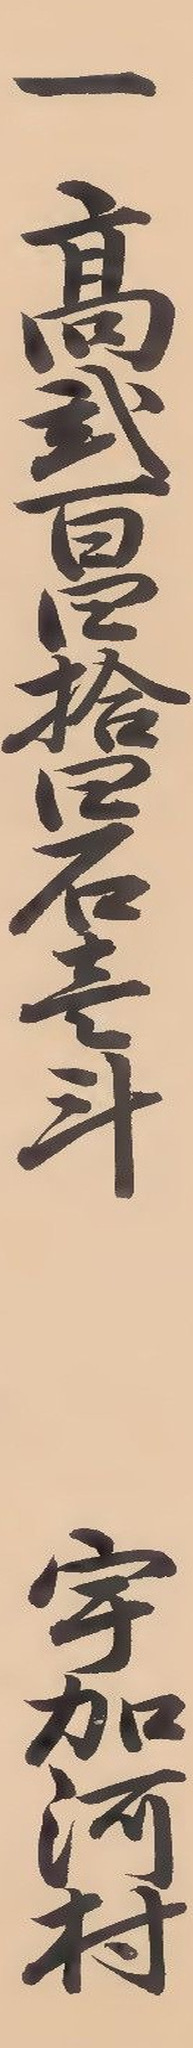一高弐百四拾四石壱斗宇加河村
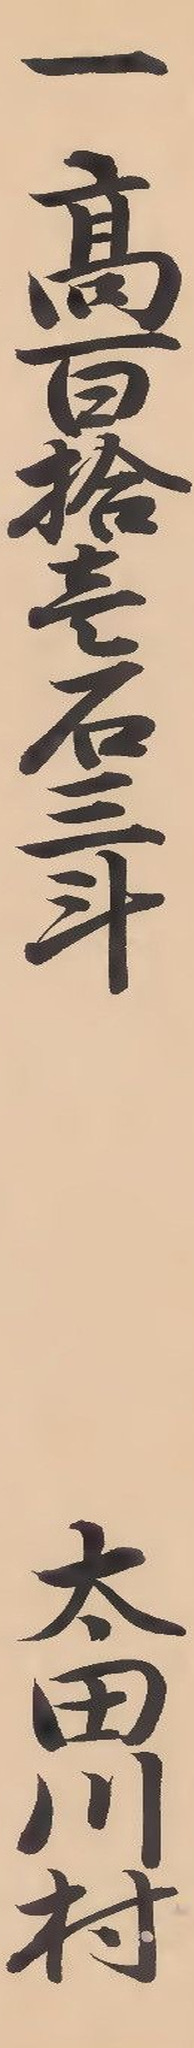一高百拾壱石三斗太田川村
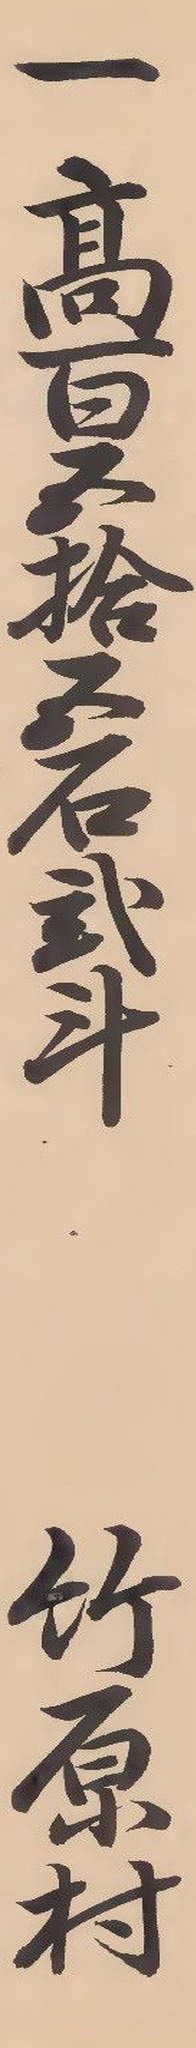一高百五拾五石弐斗竹原村
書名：能登国郷帳
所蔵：国立公文書館 National Archives of Japan
